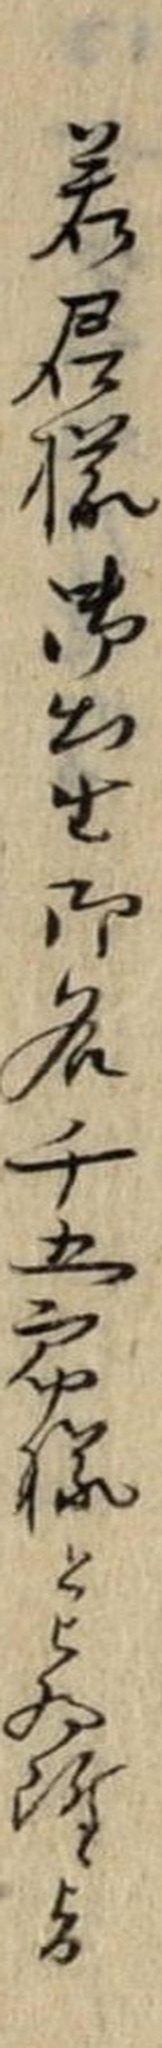若君様御出生御名千五郎様と被為附候旨
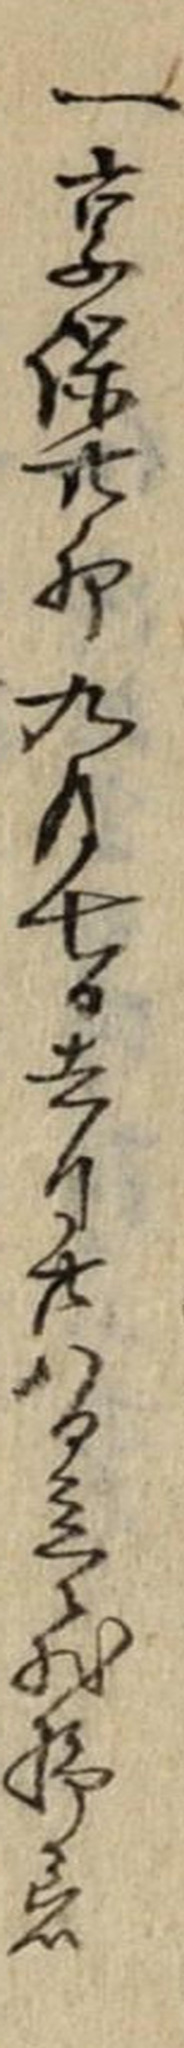一享保廿卯九月七日去月廿八日立飛脚着
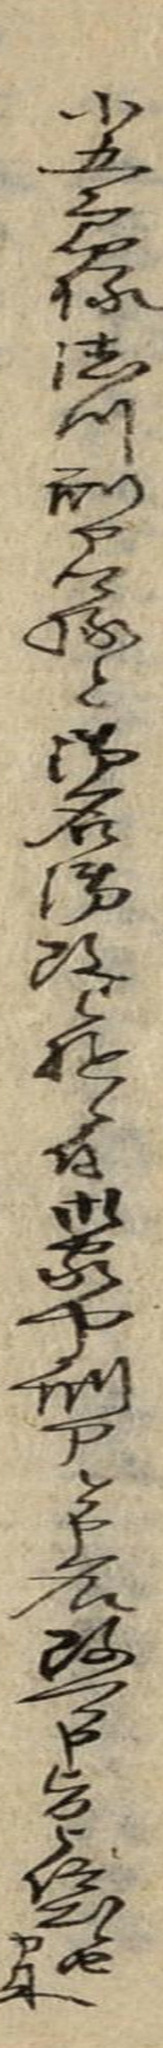小五郎様徳川刑部卿様と御名御改被遊候に付御家中刑部と申名改可申旨被仰出候由申来
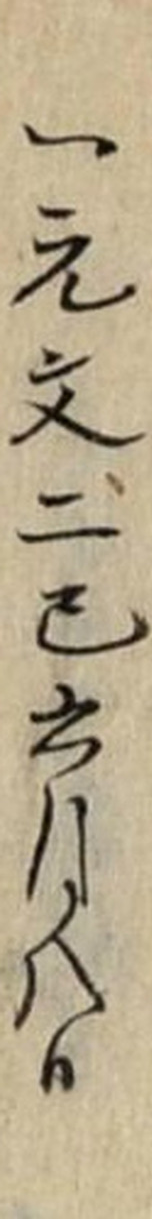一元文二巳六月八日
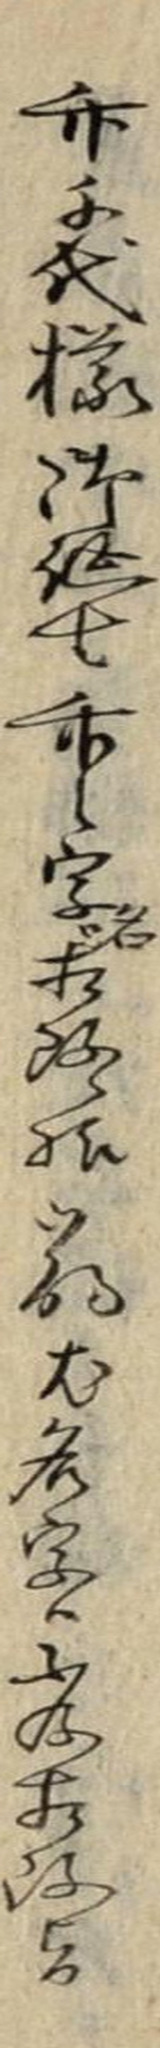竹千代様御誕生竹之字◦名相改候様御触尤名字は不及相改旨
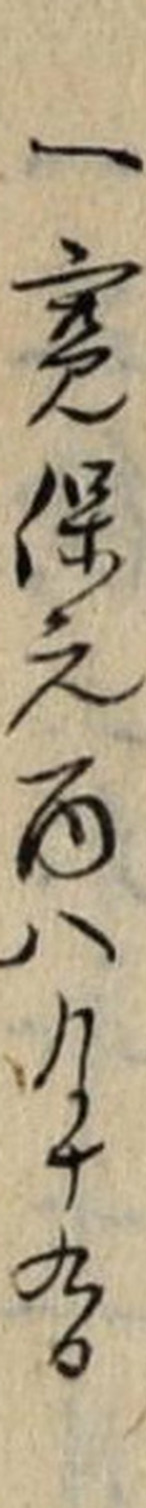一寛保元酉八月十九日
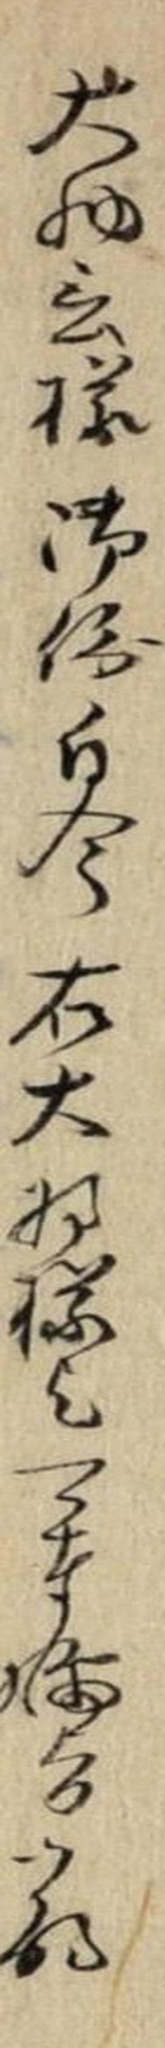大納言様御儀自今右大将様と可奉称旨御触
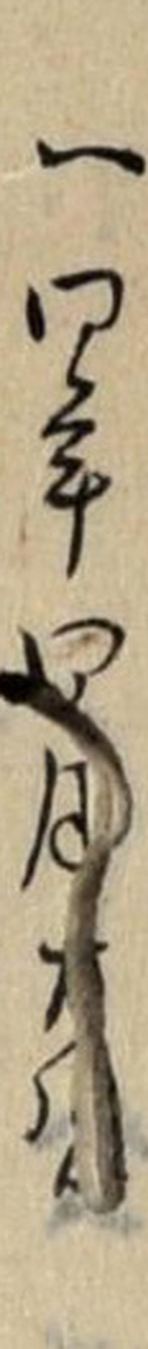一同年四月廿日
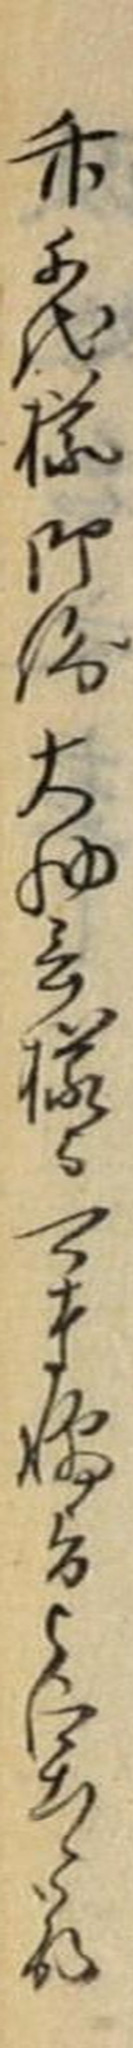竹千代様御儀大納言様と可奉称旨被仰出候御触
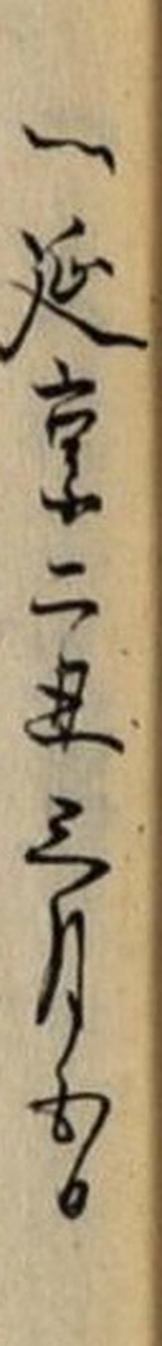一延享二丑三月五日
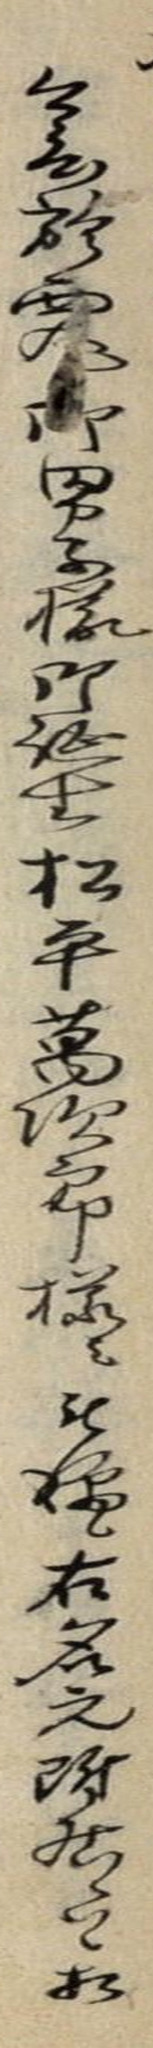今度於西之丸男子様御誕生松平萬次郎様と被称候右名元附居候はゝ相
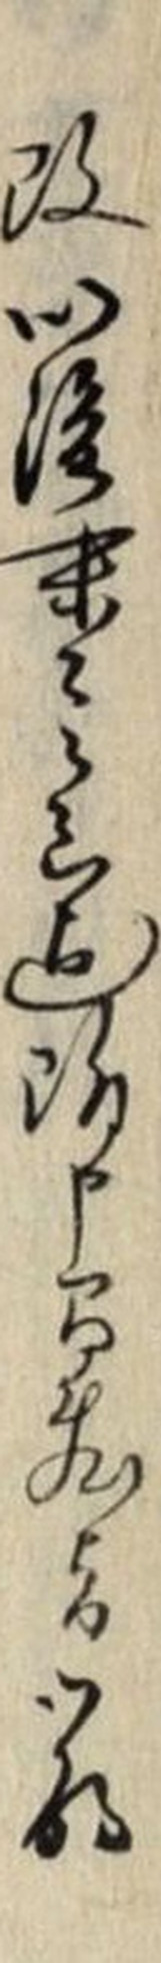改以後末々に至迄附申間敷旨御触
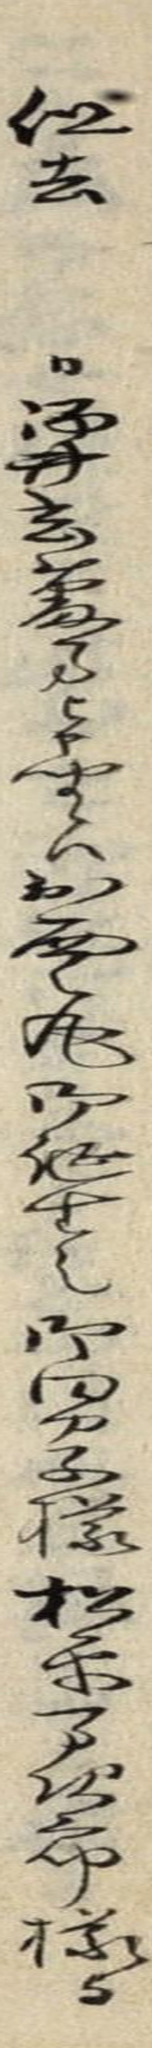但去日酒井玄蕃方被申聞候は於西之丸御誕生之御男子様松平万次郎様と
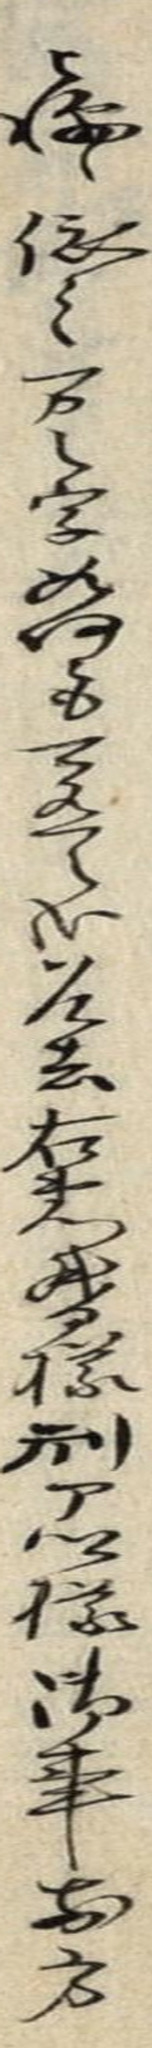被称候依之万之字如何にも可有候哉乍去右衛門督部様刑部卿様御事前方
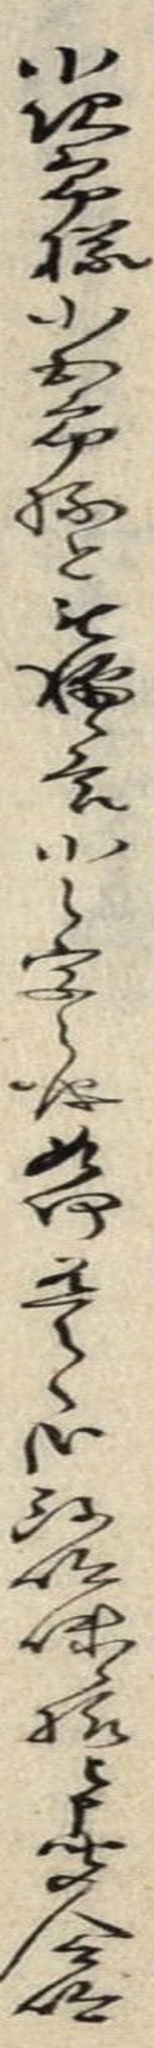小次郎様小五郎様と被称候節小之字之儀如何有之候哉致吟味候様被申聞令吟
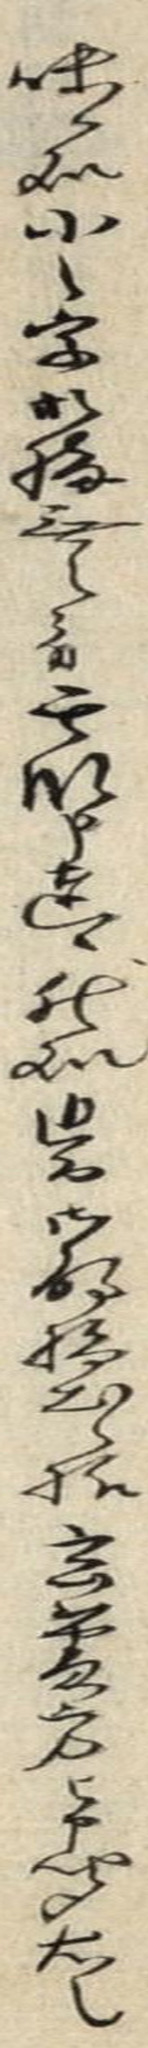味候処小之字御構無之候に付其段申達候然処追而御触指出候様玄蕃方被申聞右之
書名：蒐輯之部
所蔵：福井県文書館 Fukui Prefectural Archives
